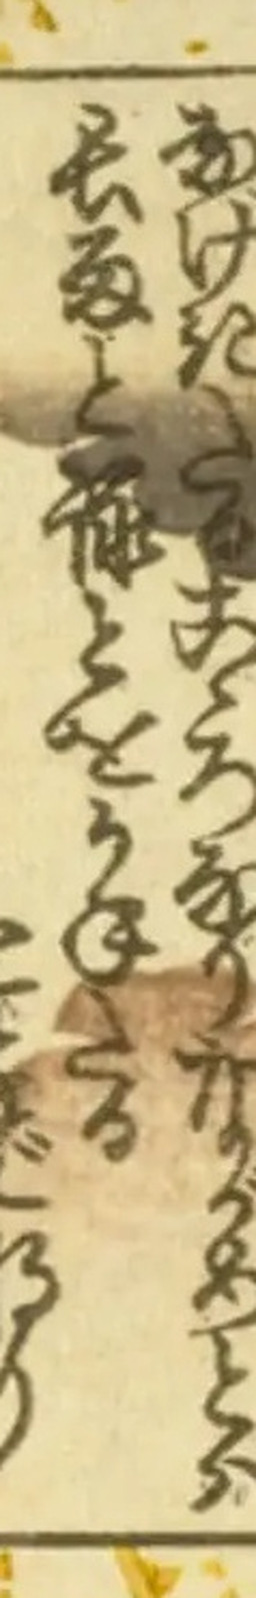長雨と眺とをかねたる
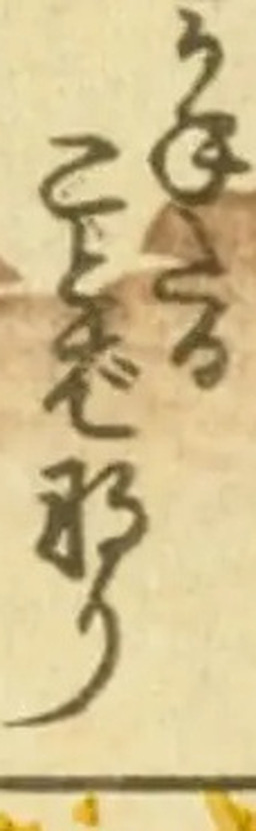ことばなり
